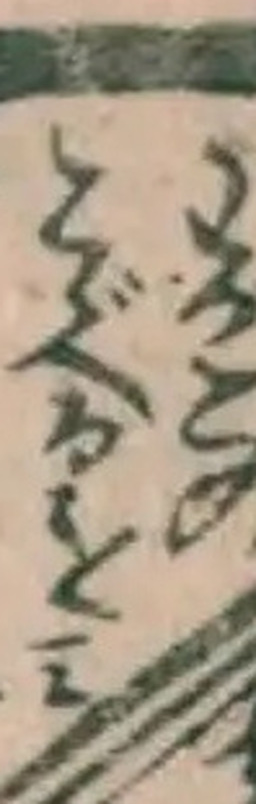こゞへるをみて
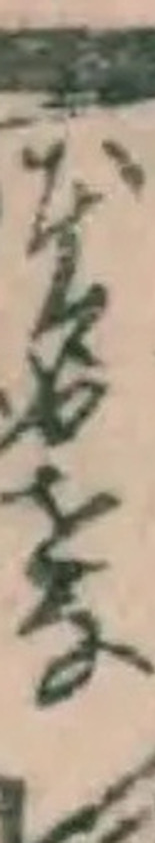本名をな
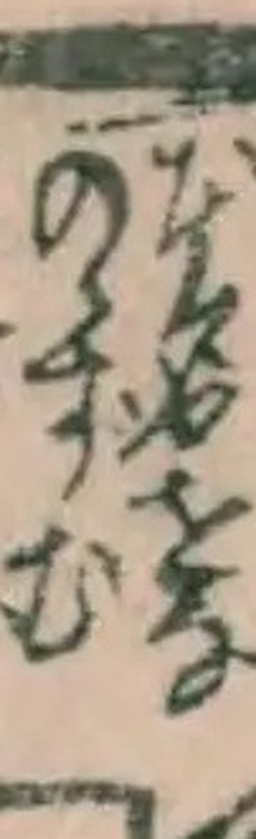のらずむ
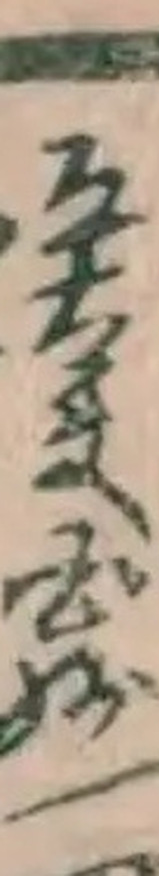平太夫国妙
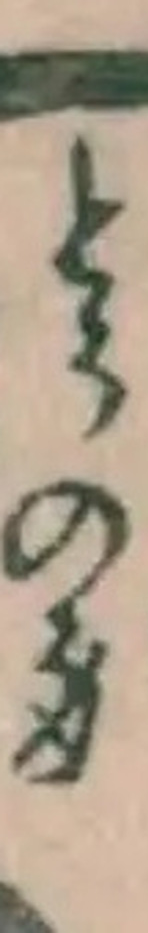とうの身
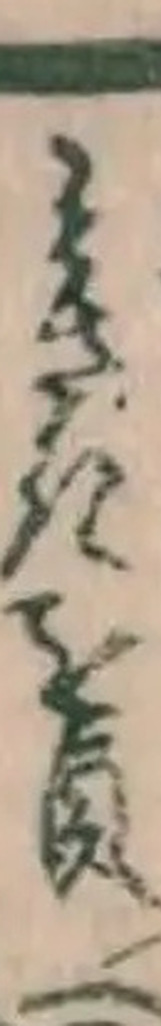みさきを貞
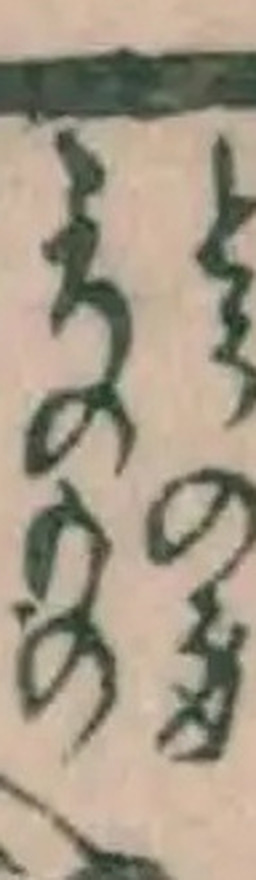よりのもの
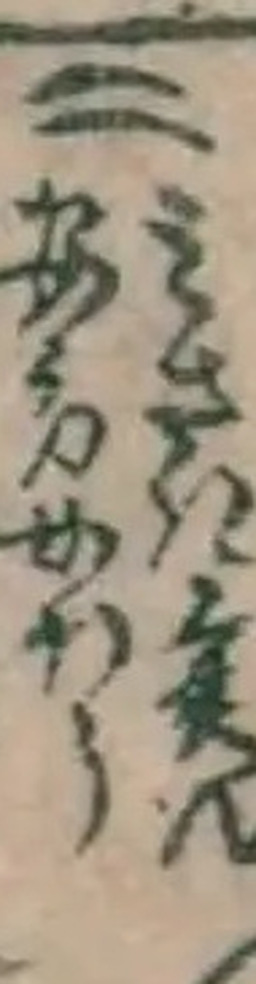安方女ほう
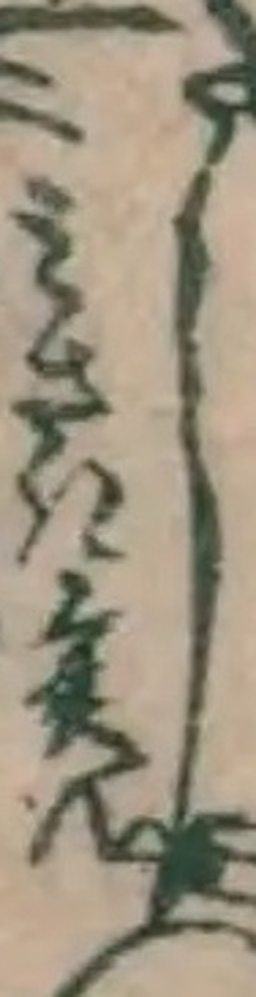みさき実は
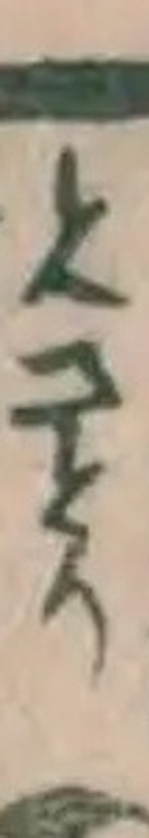とさとり
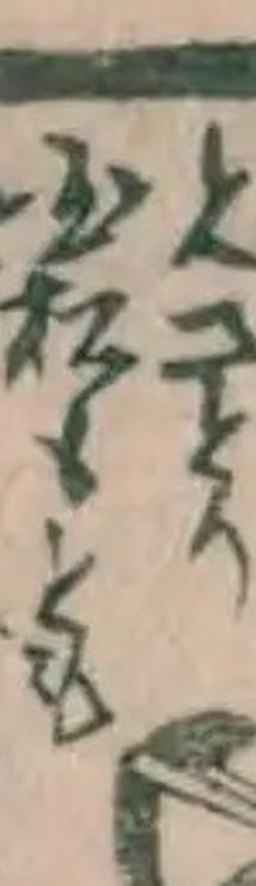国松もとも
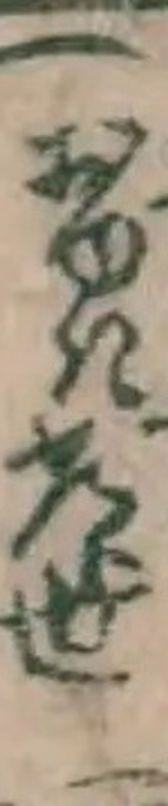おゆき常世
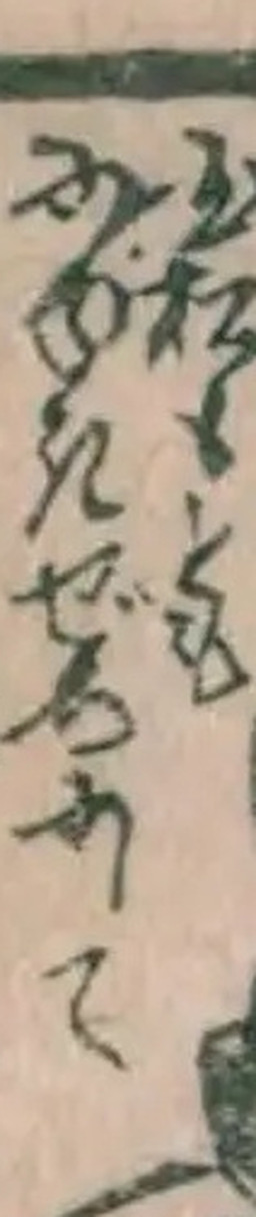にゆきぜめにして
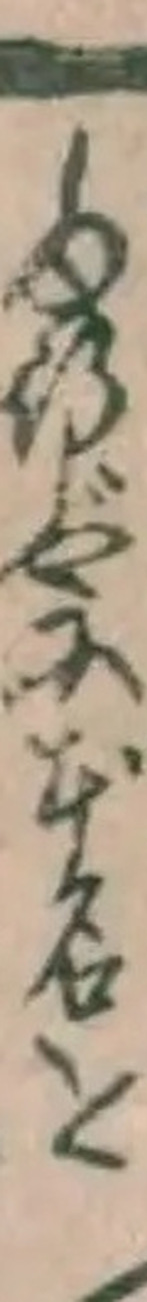しゆ行じやに本名を
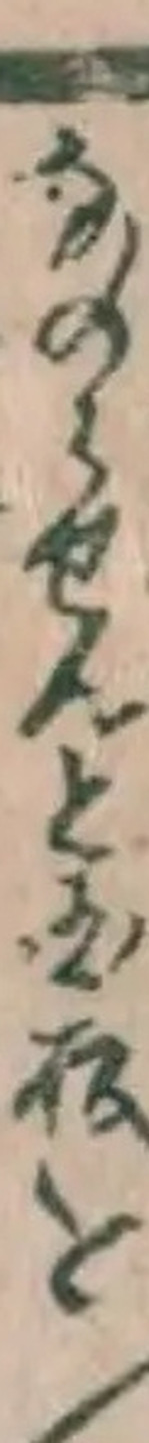なのらせんと国松を
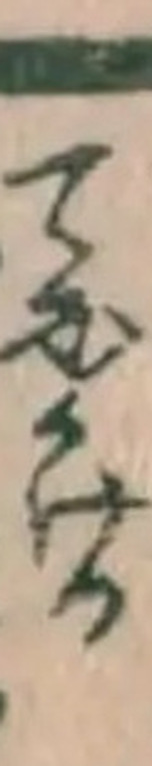てにかける
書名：伊達錦對将 : 森田座
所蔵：国立国会図書館 National Diet Library, JAPAN
